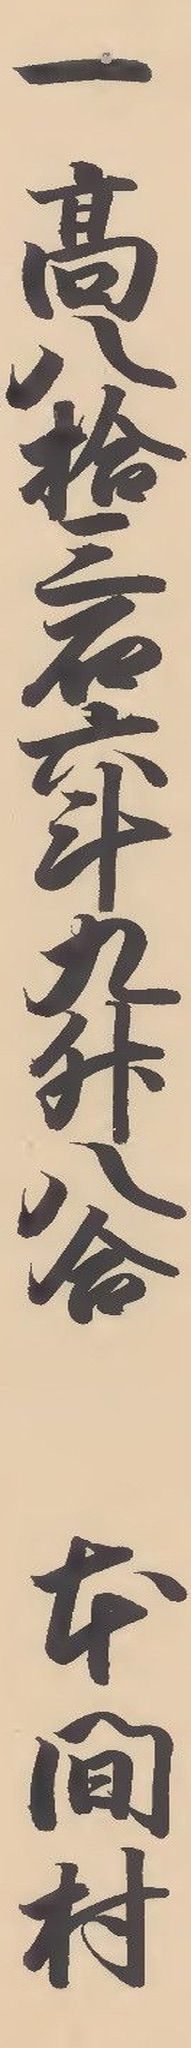一高八拾三石六斗九升八合本間村
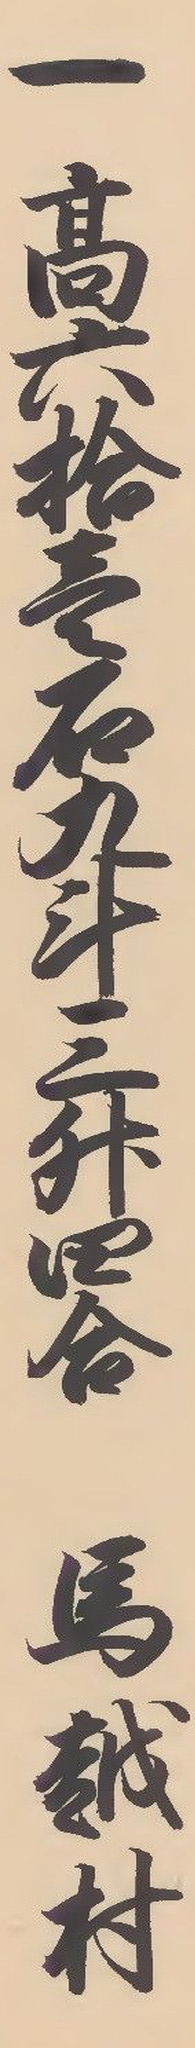一高六拾壱石九斗三升四合馬越村

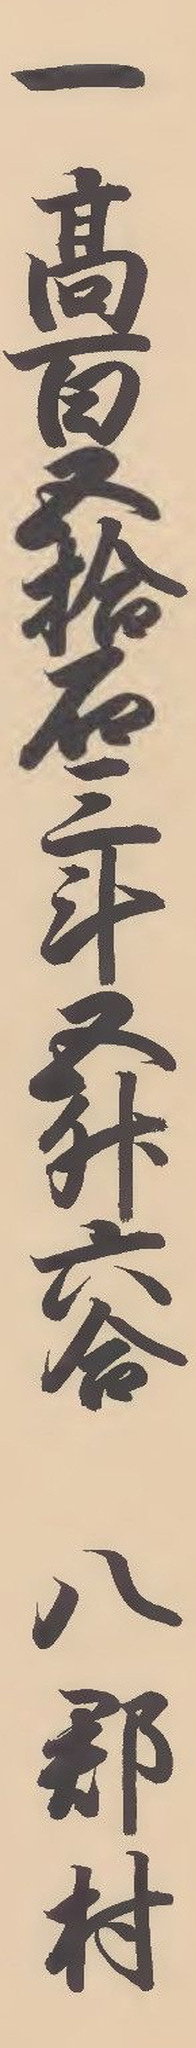一高百五拾石三斗五升六合八郡村
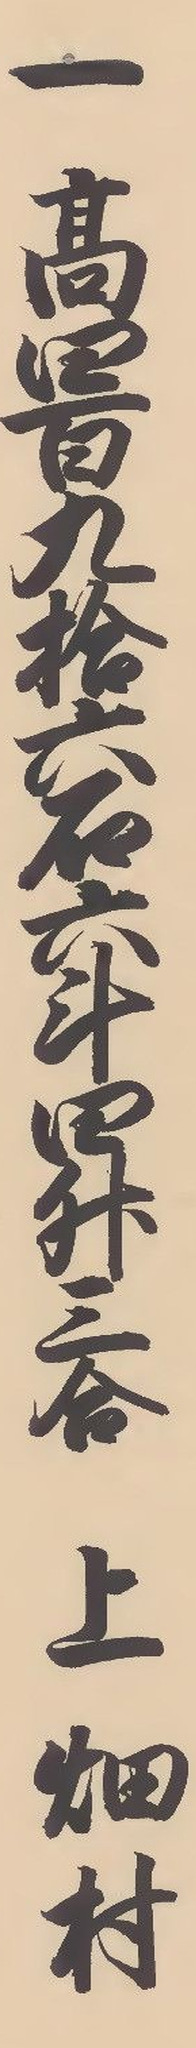一高四百九拾六石六斗四升三合上畑村
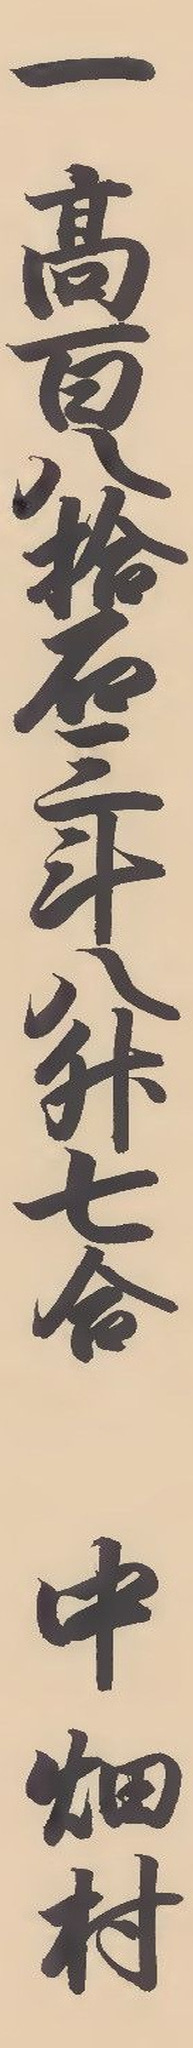一高百八拾石三斗八升七合中畑村
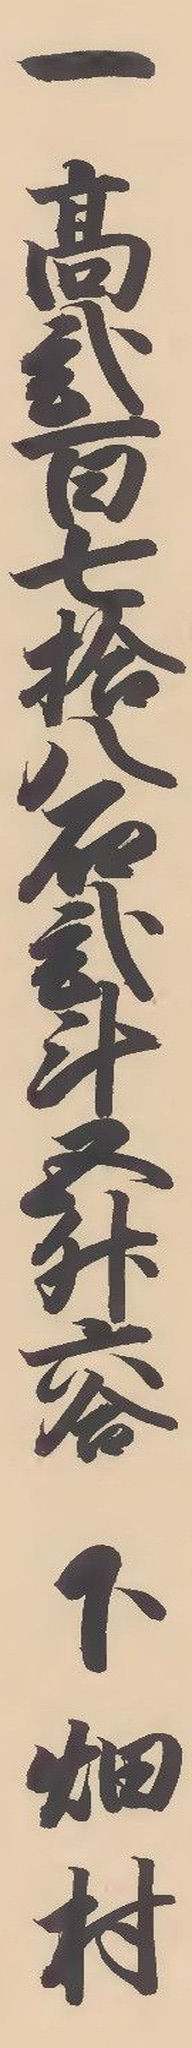一高弐百七拾八石弐斗五升六合下畑村
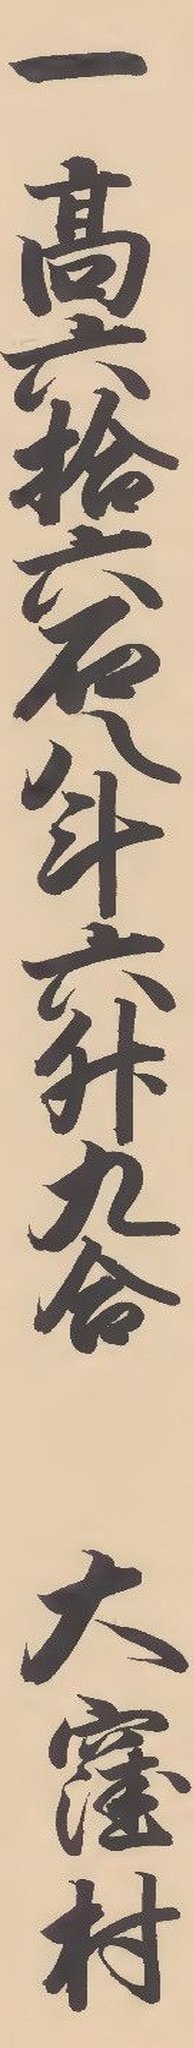一高六拾六石八斗六升九合大窪村
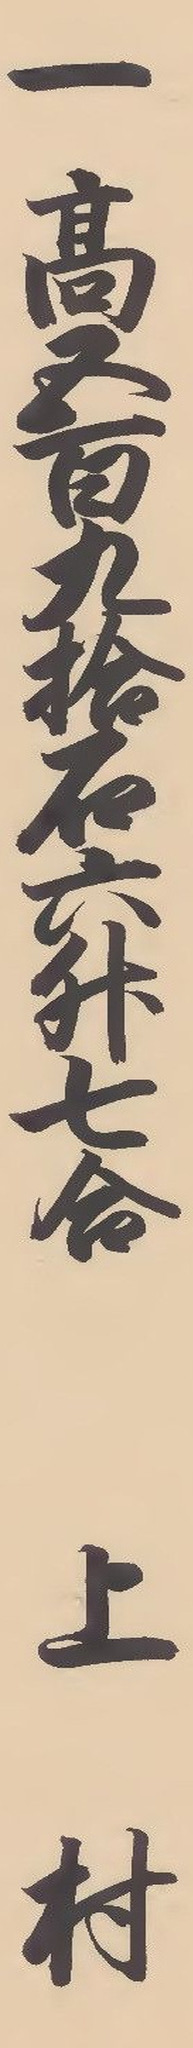一高五百九拾石六升七合上村
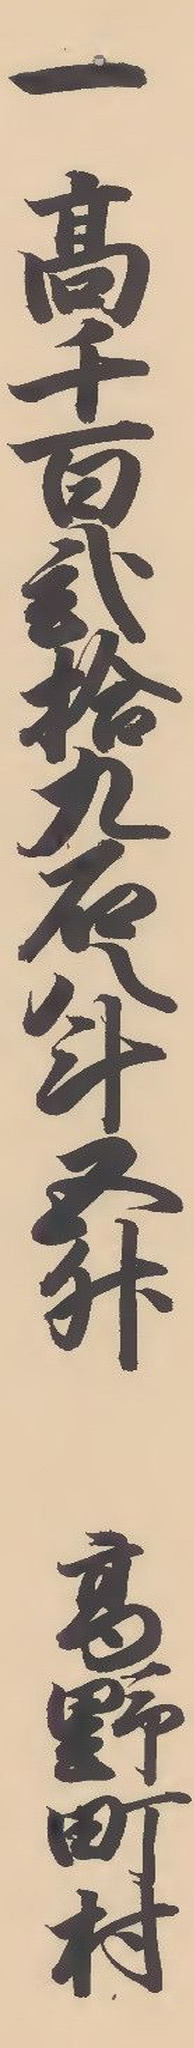一高千百弐拾九石八斗五升高野町村
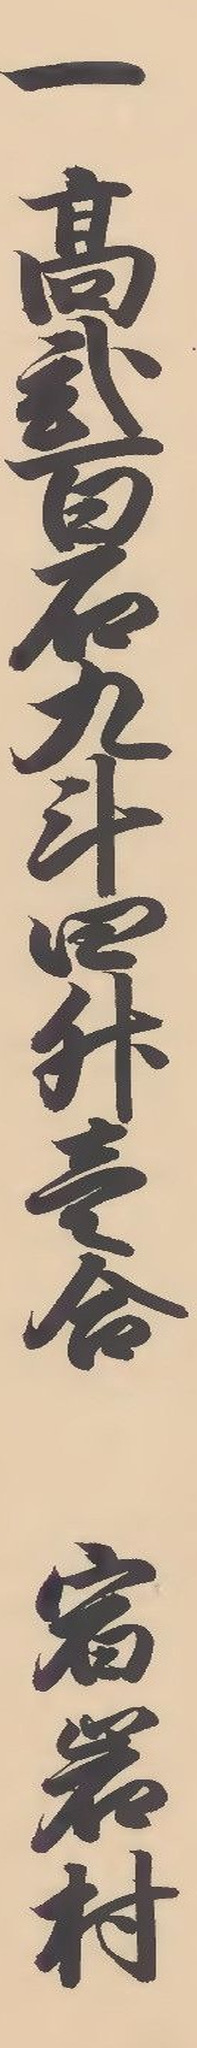一高弐百石九斗四升壱合宿岩村

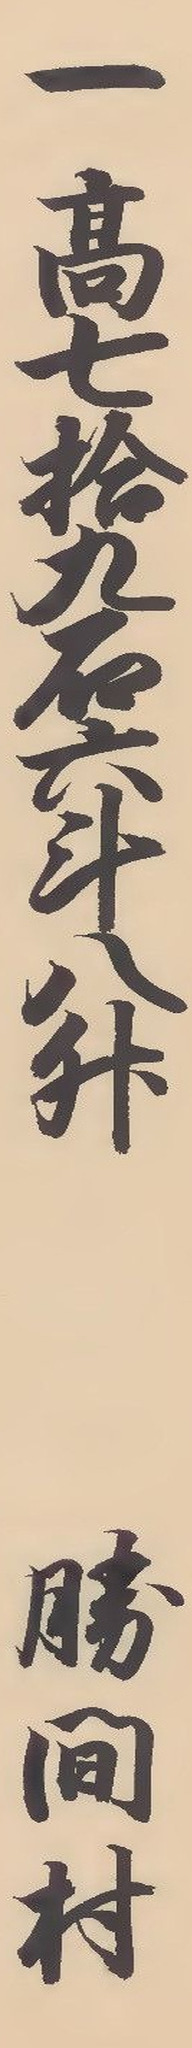一高七拾九石六斗八升勝間村
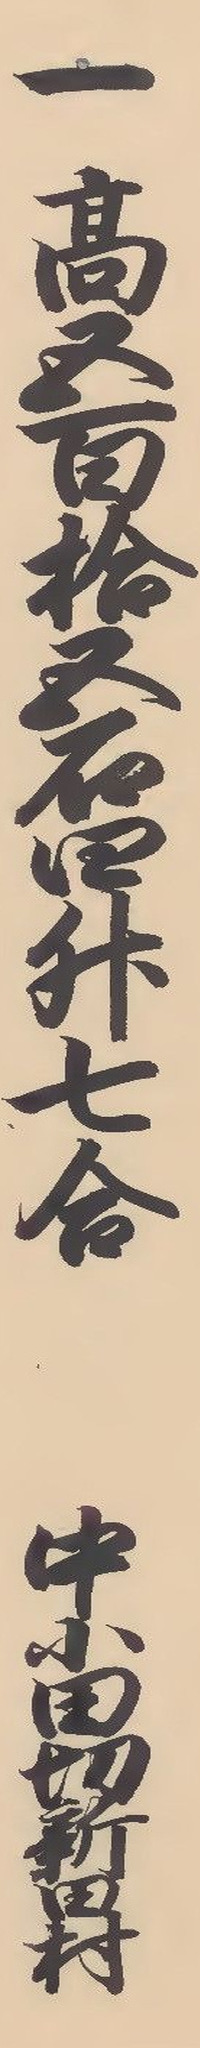一高五百拾五石四升七合中小田切新田村
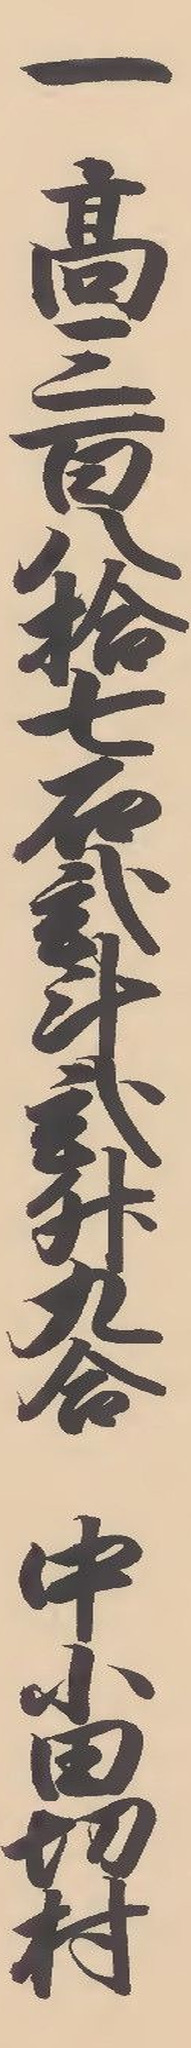一高三百八拾七石弐斗弐升九合中小田切村
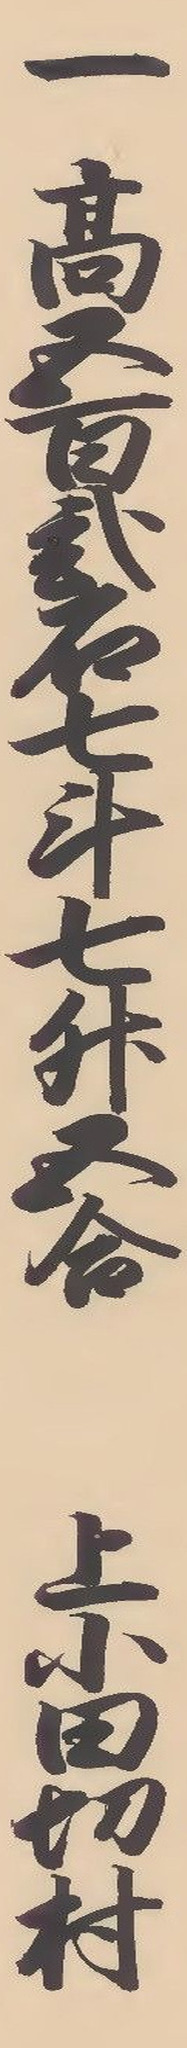一高五百弐石七斗七升五合上小田切村
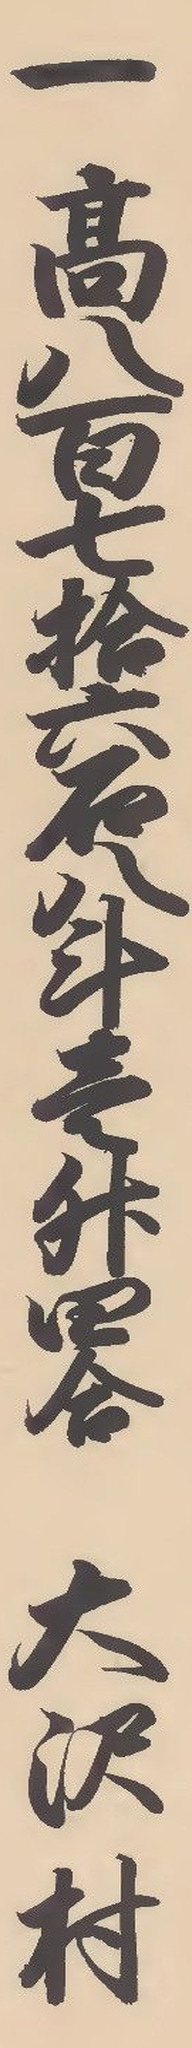一高八百七拾六石八斗壱升四合大沢村
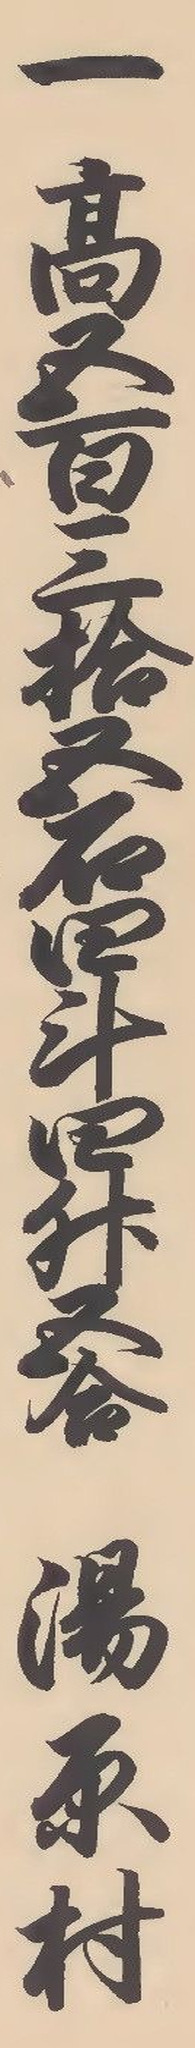一高五百三拾五石四斗四升五合湯原村
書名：信濃国郷帳
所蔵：国立公文書館 National Archives of Japan
